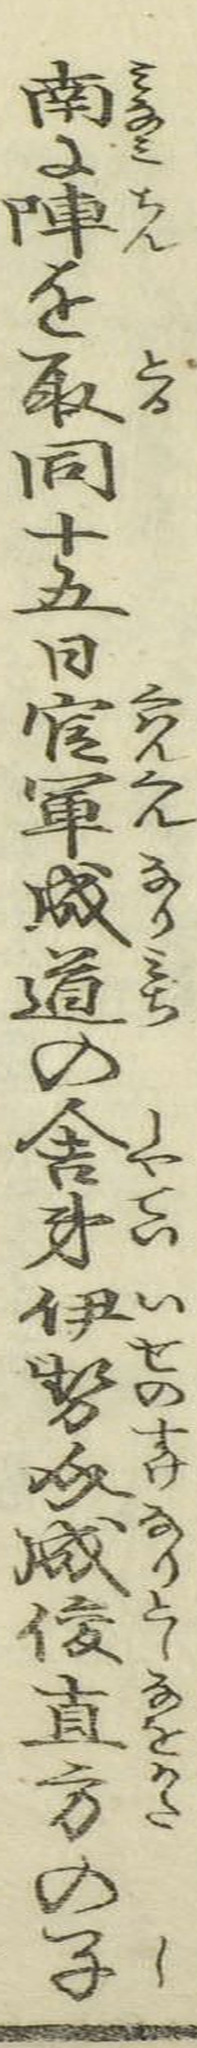南に陣を取同十五日官軍成道の舎弟伊勢介成俊直方の子
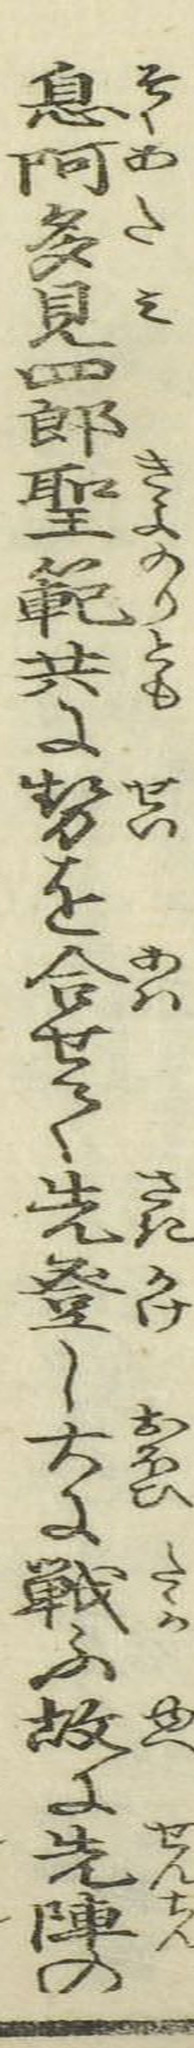息阿多見四郎聖範共に勢を合せて先登し大に戦ふ故に先陣の
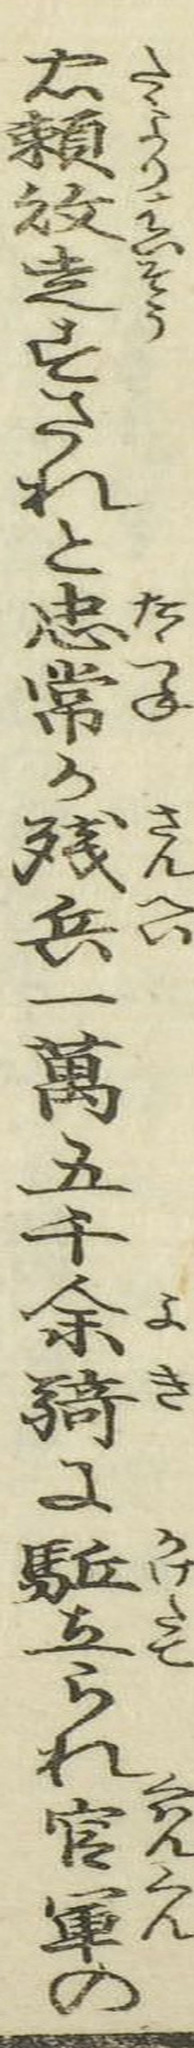忠頼敗走すされと忠常か残兵一万五千余騎に駆立られ官軍の
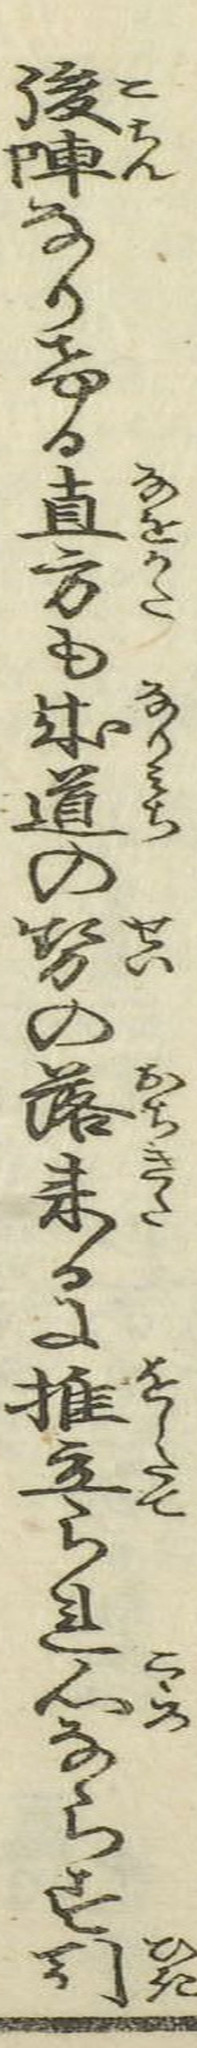後陣なりける直方も成道の勢の落来るに推立られ心ならす引
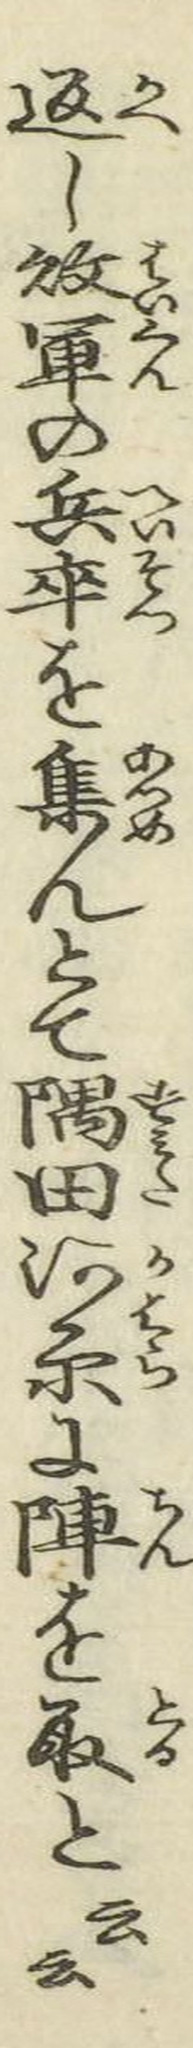返し敗軍の兵卒を集んとて隅田河原に陣を取と云云
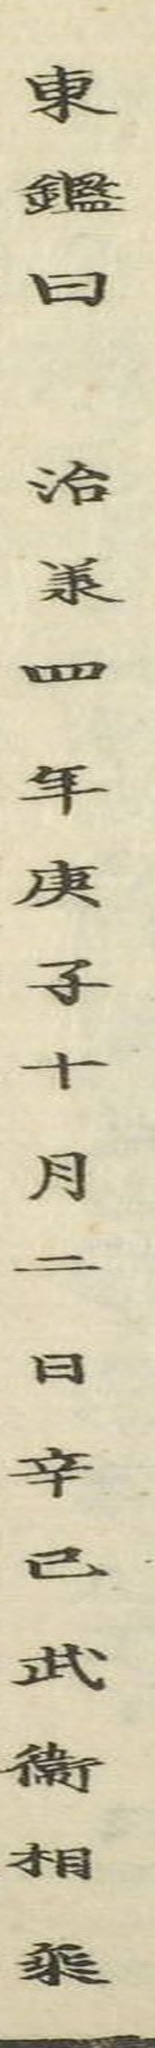東鑑曰治承四年庚子十月二日辛己武衛相乗
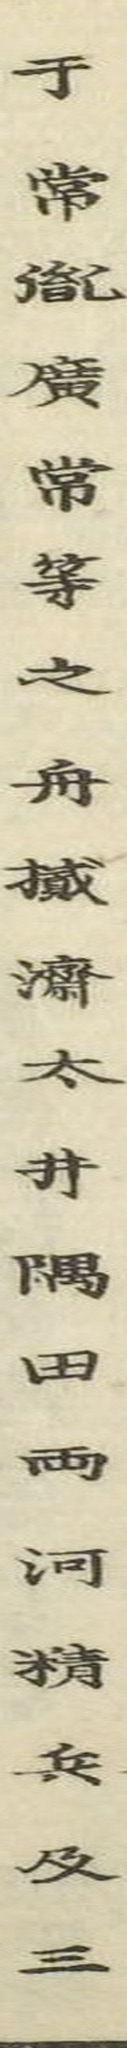于常胤広常等之舟太井隅田両河精兵及三
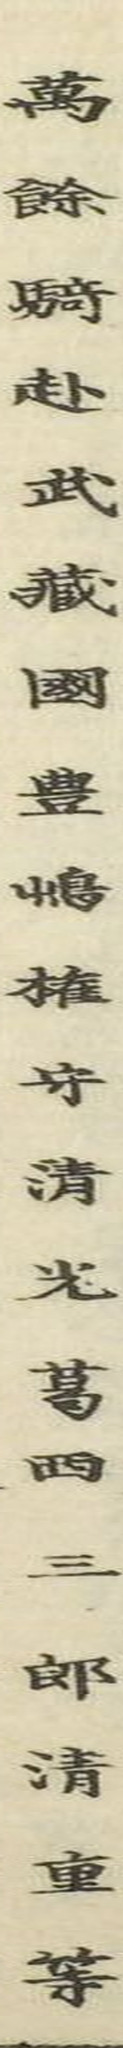万余騎赴武蔵国豊島権守清光葛西三郎清重等
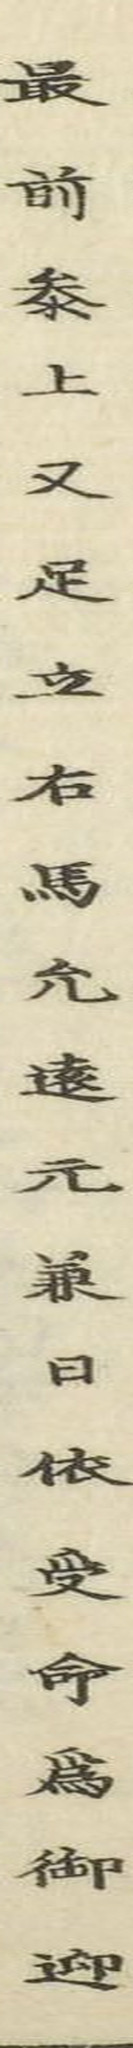最前参上又足立右馬允遠元兼日依受命為御迎
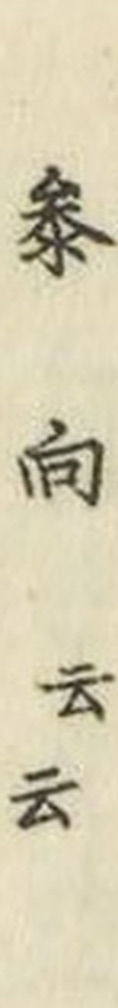参向云云
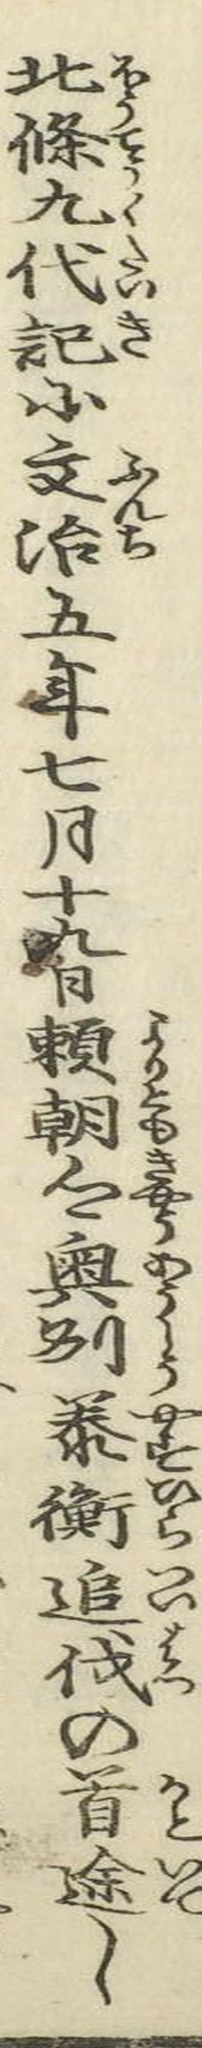北条九代記に文治五年七月十九日頼朝卿奥州泰衡追伐の首途し
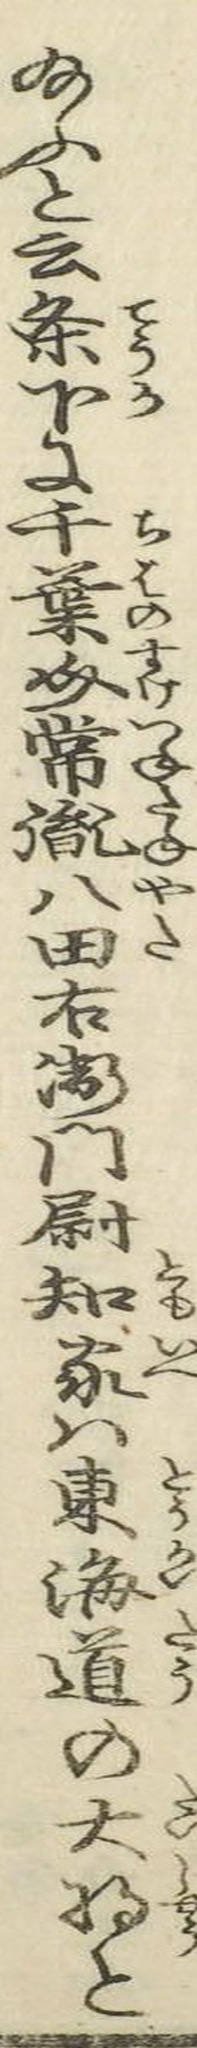給ふと云条下に千葉介常胤八田右衛門尉知家は東海道の大将と
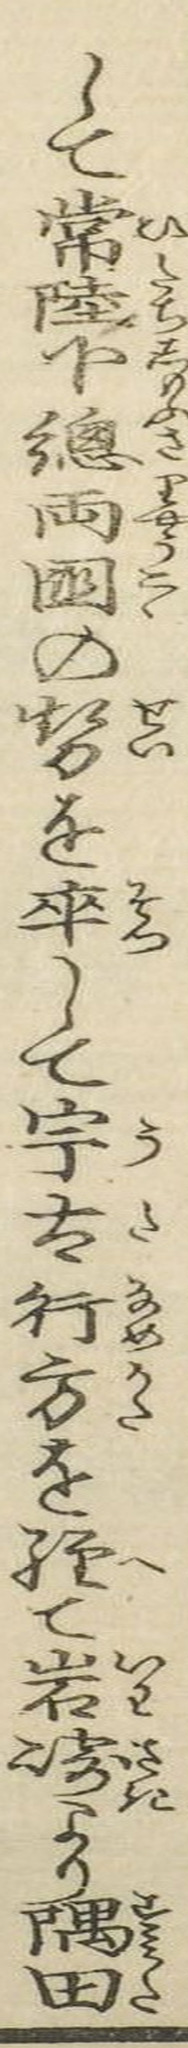して常陸下総両国の㔟を卒して宇太行方を経て岩崎より隅田
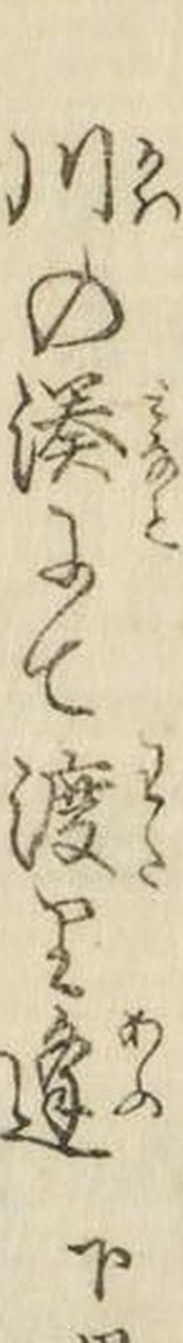川の湊にて渡り逢下略
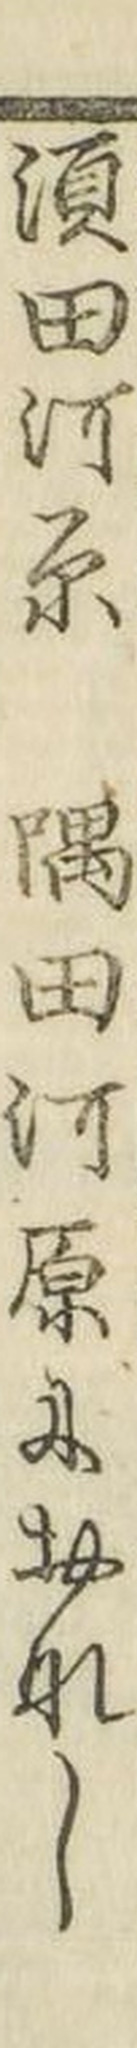須田河原隅田河原におなし
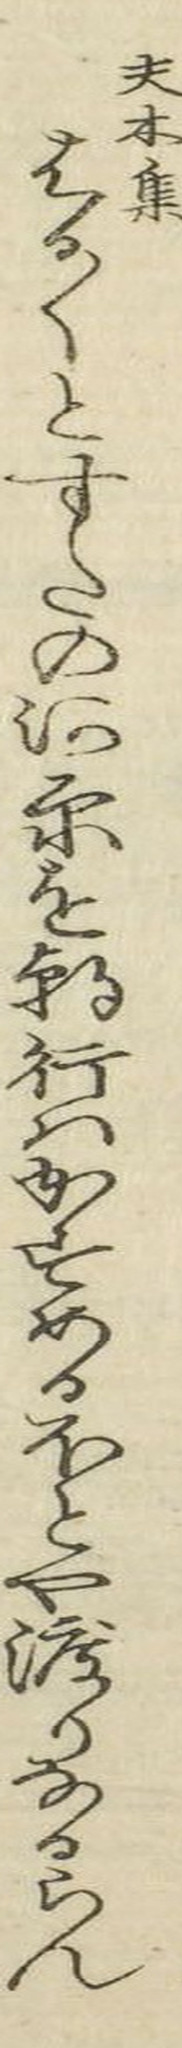はる〳〵とすたの河原を朝行はかすめるほとや渡りなるらん
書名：江戸名所図会 20巻 巻之19
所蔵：東京学芸大学教育コンテンツアーカイブ
